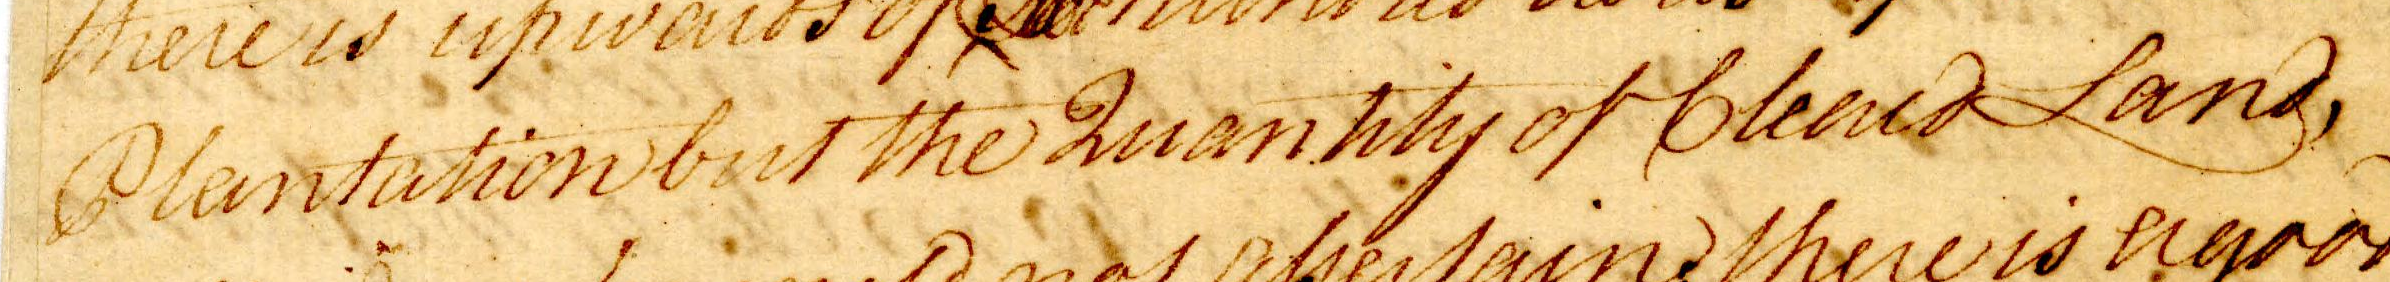Plantation but the Quantity of Cleared Land,
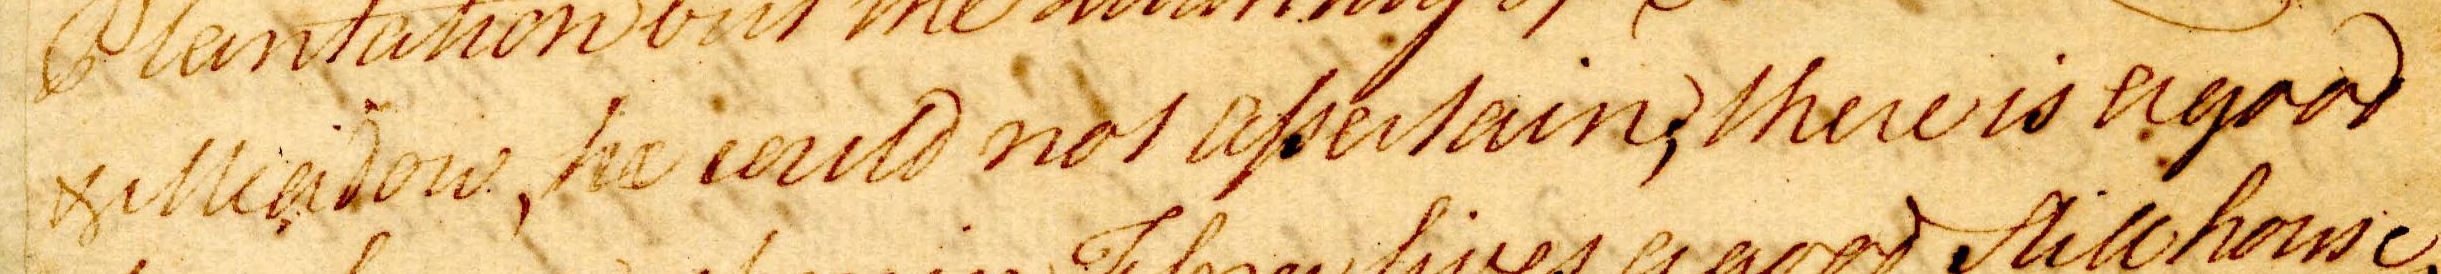& Meadow he could nor assertain, there is a good
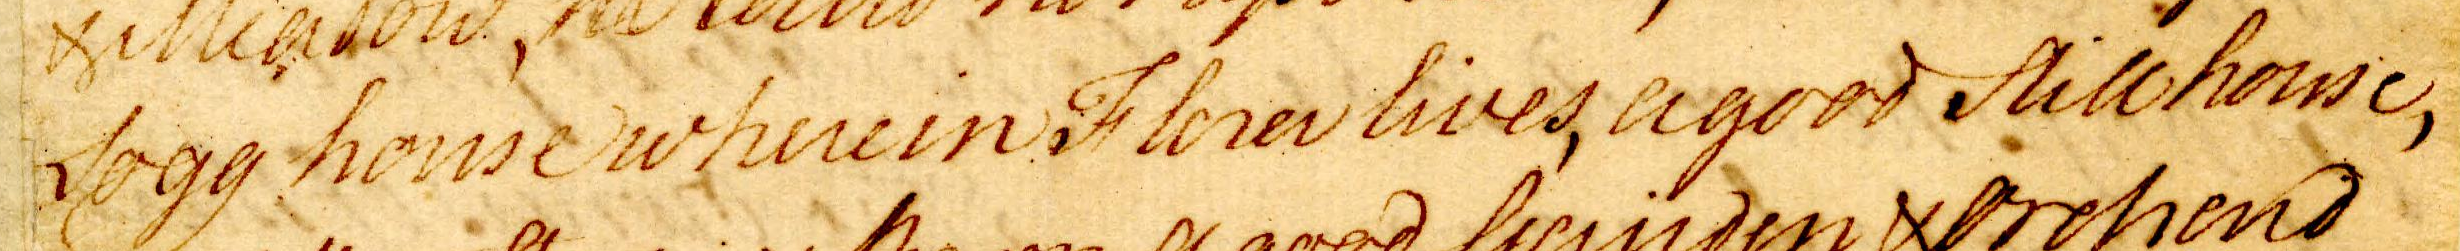Logg house wherein Flora lives, a good Stillhouse,
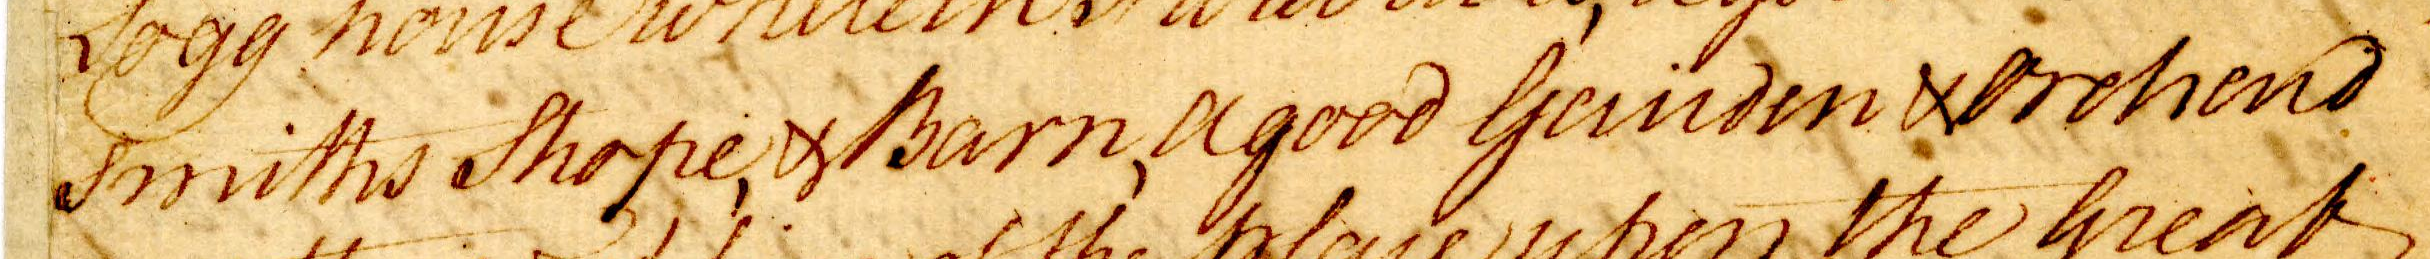Smiths Shape, & Barn, a good Garden & Orchard
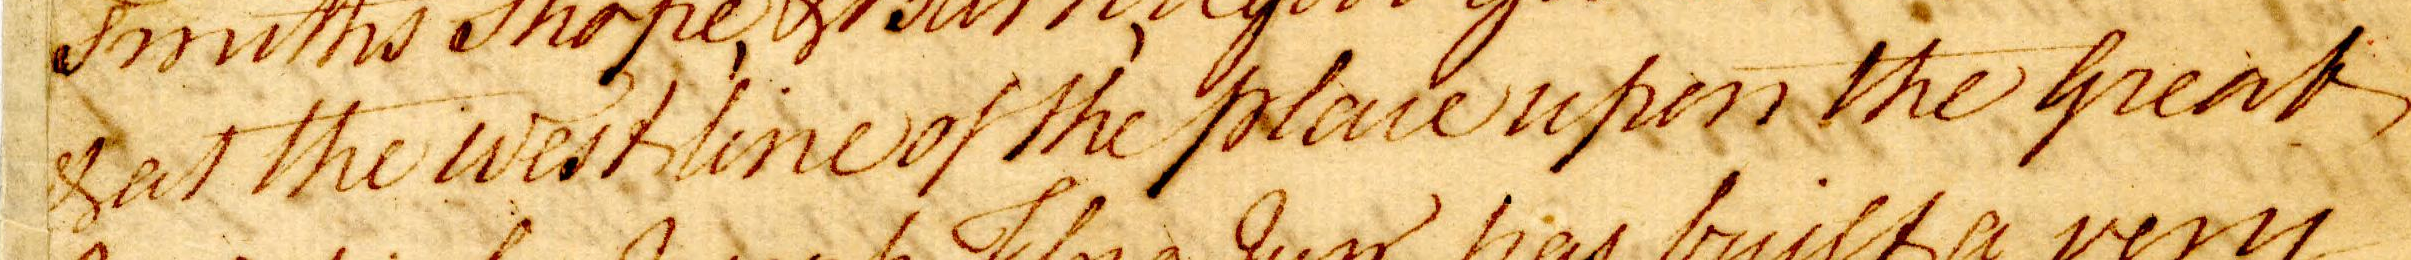& at the west line of the place upon the Great
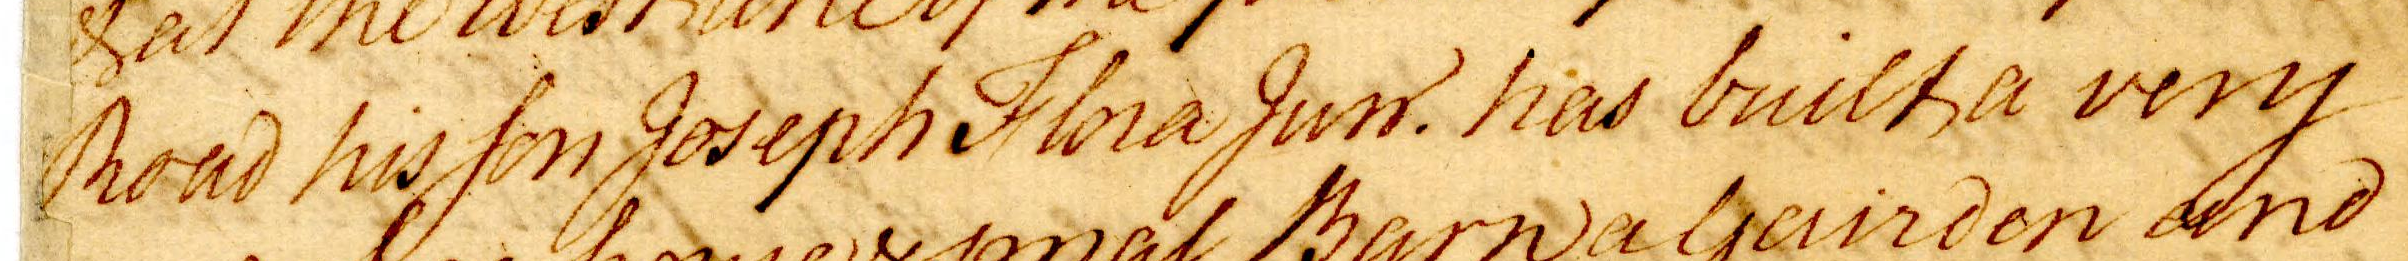Road his son Joseph Flora Jun. has built a very
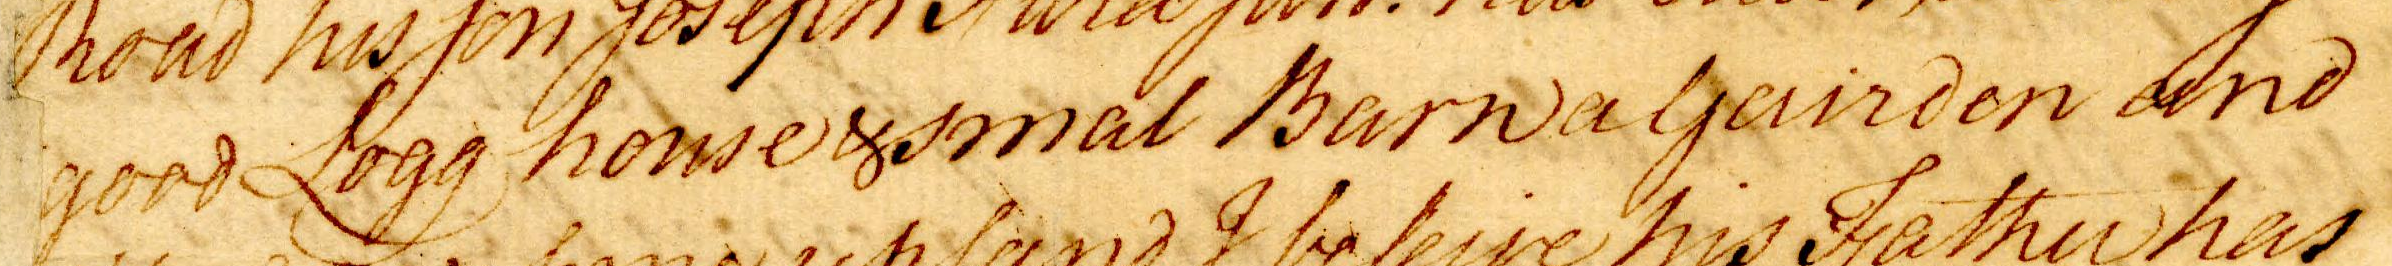good Logg house & small Barn a Garden and
